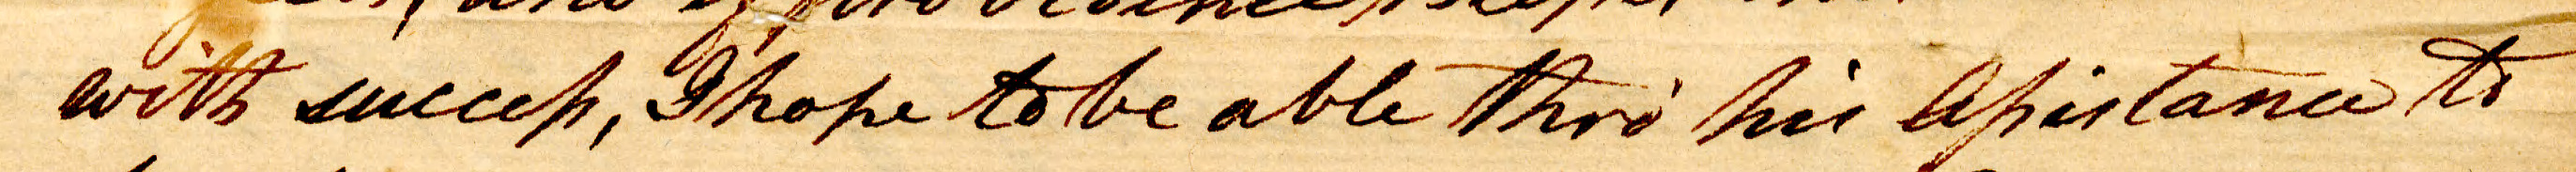with success, I hope to be able thro' his Assistance to
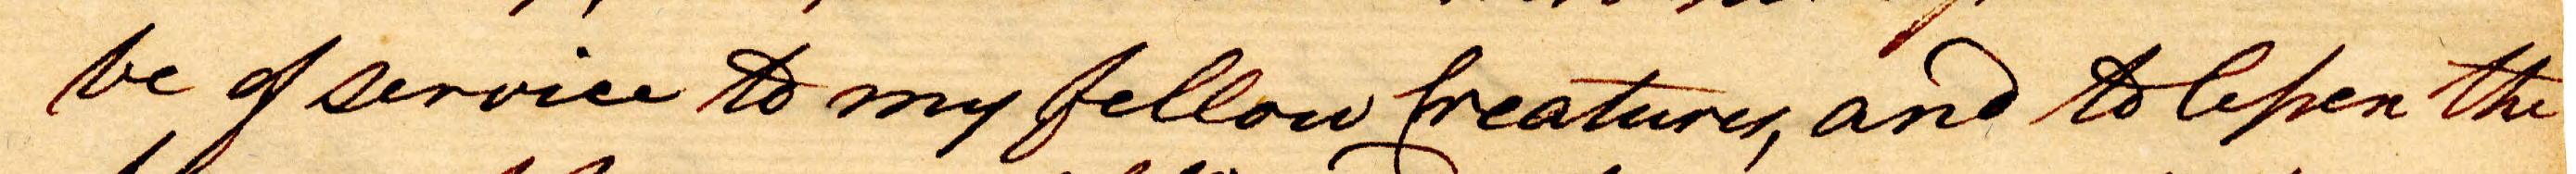be of service to my fellow Creatures, and to lessen the
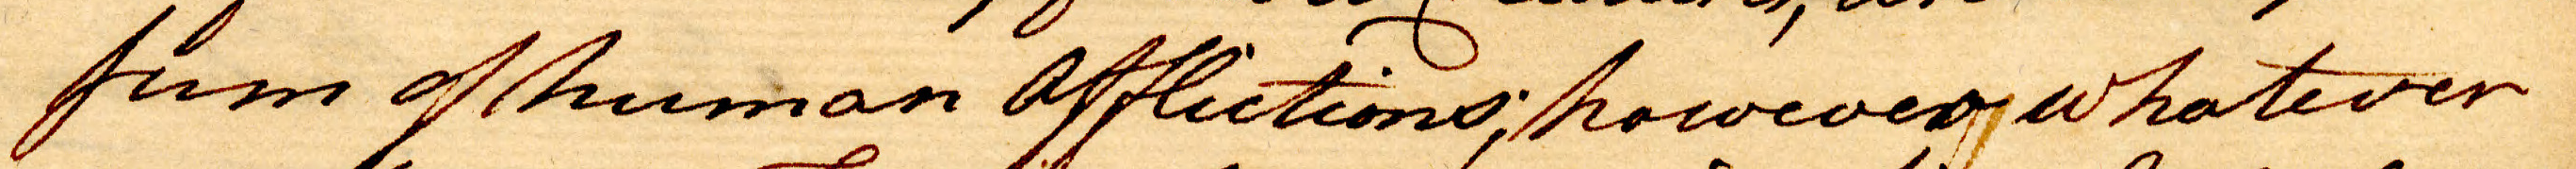sum of human Afflictions; however whatever
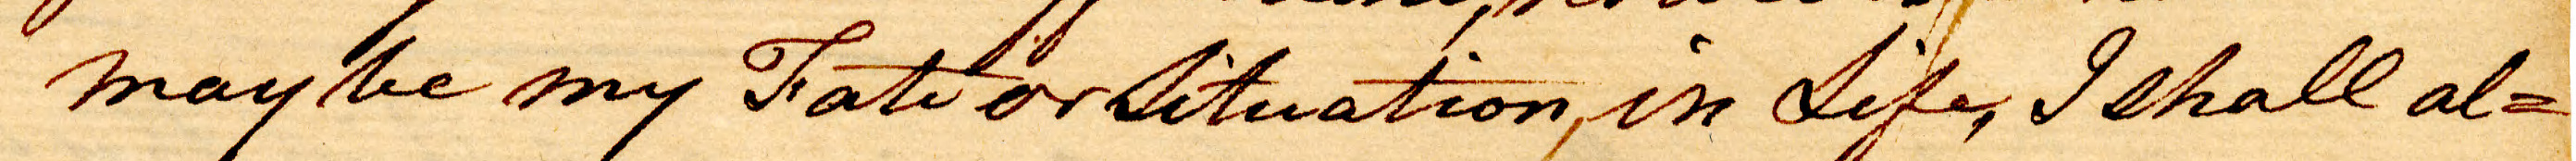may be my Fate or Situation in Life, I shall al-
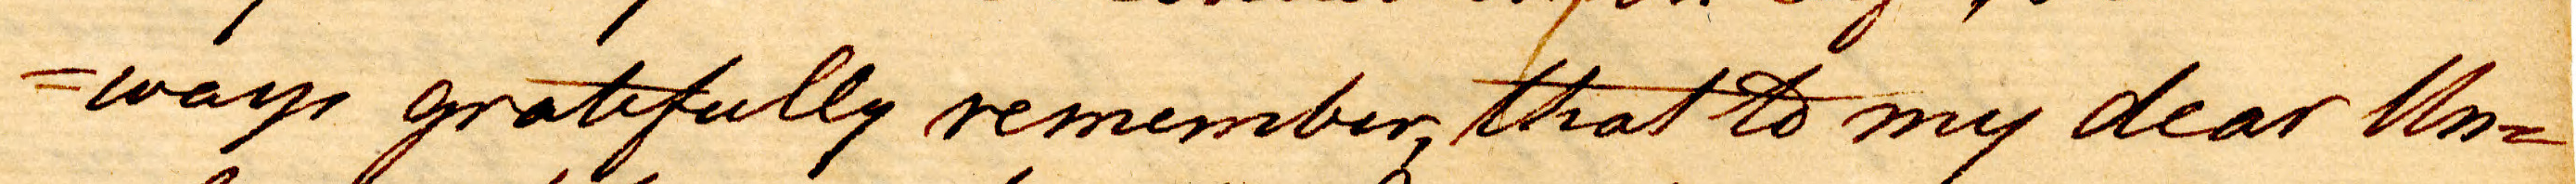-ways gratefully remember that to my dear Un-
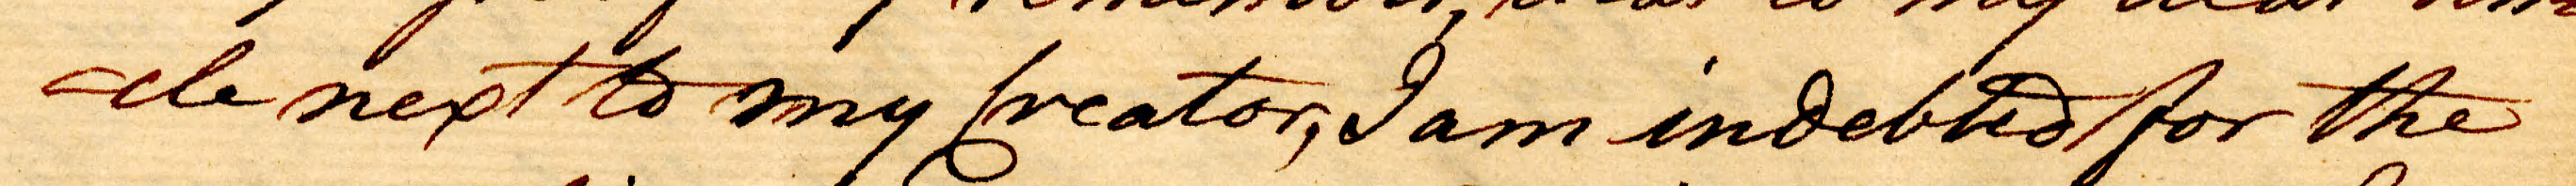-cle next to my Creator, I am indebted for the
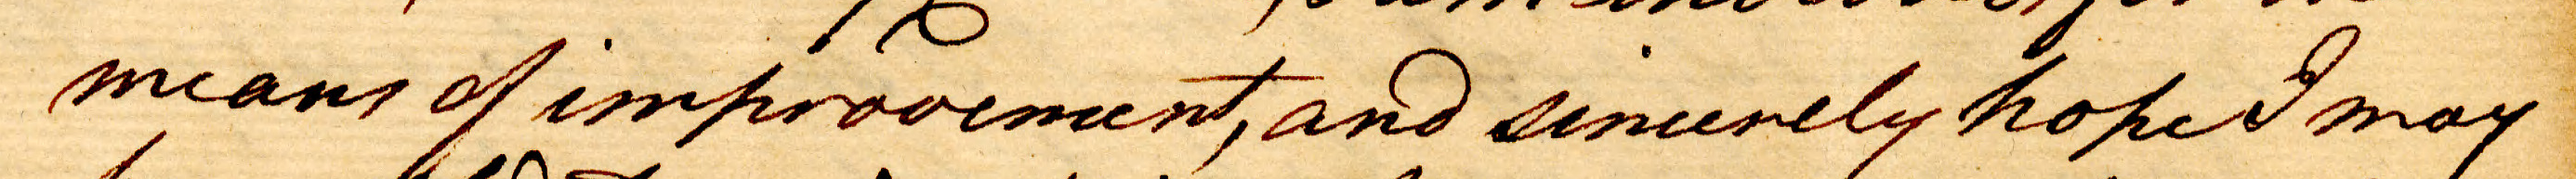means of improvement, and sincerely hope I may
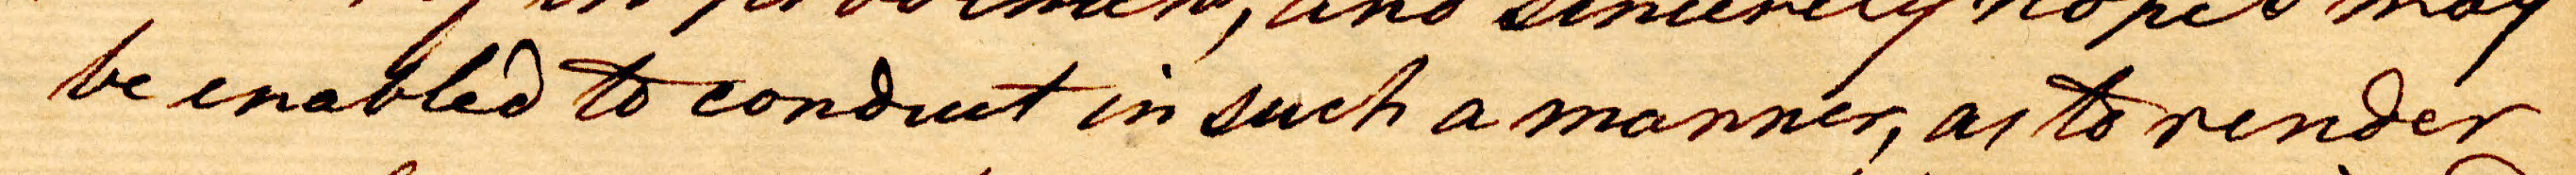be enabled to conduct in such a manner, as to render
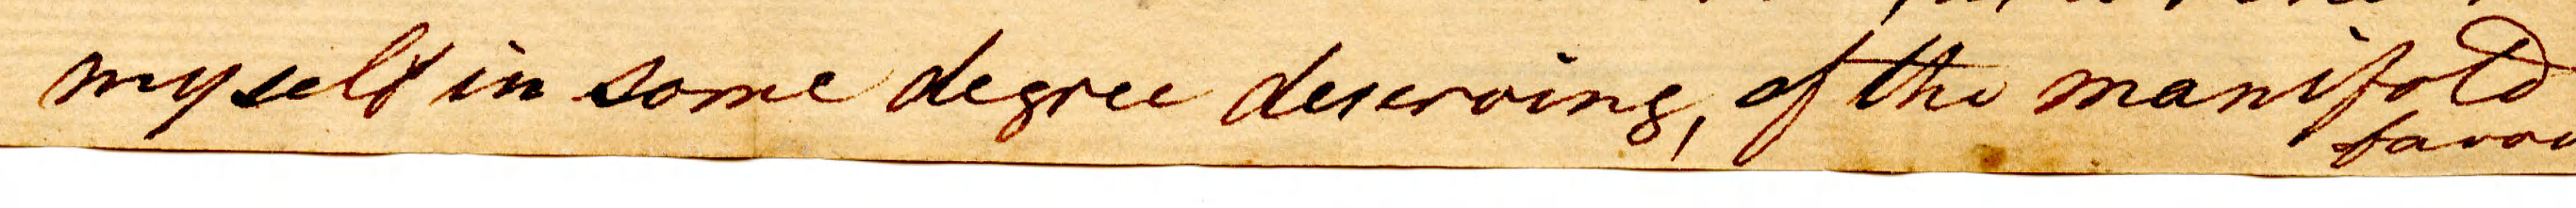myself in some degree deserving, of the maniold
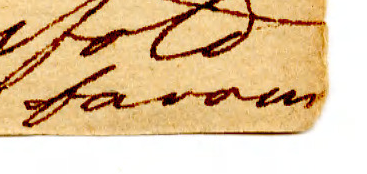favour
